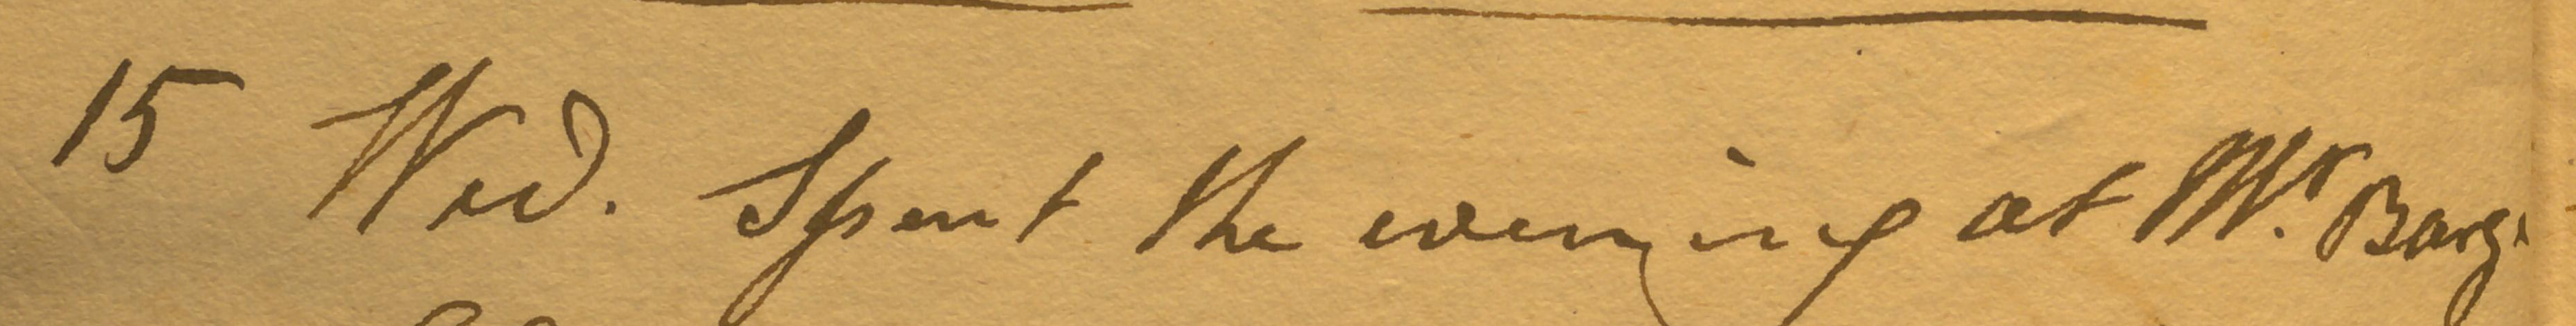15 Wed. spent the evening at M^r. Barge
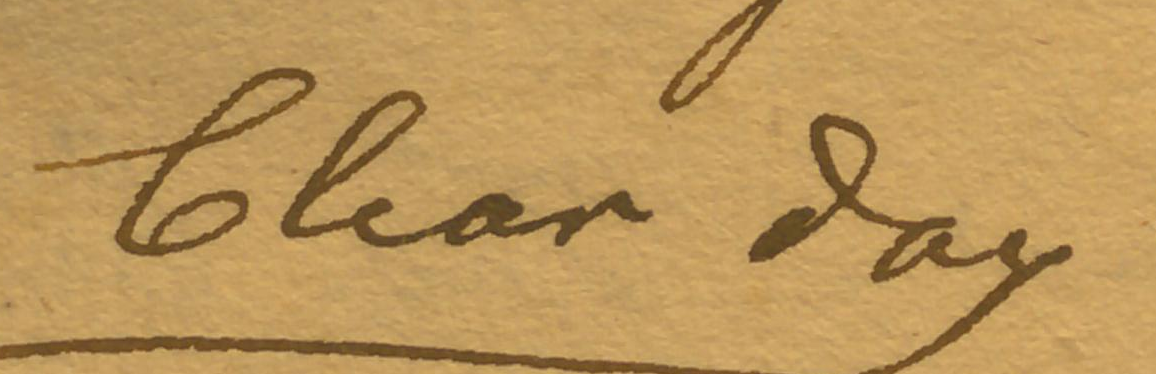Clear day
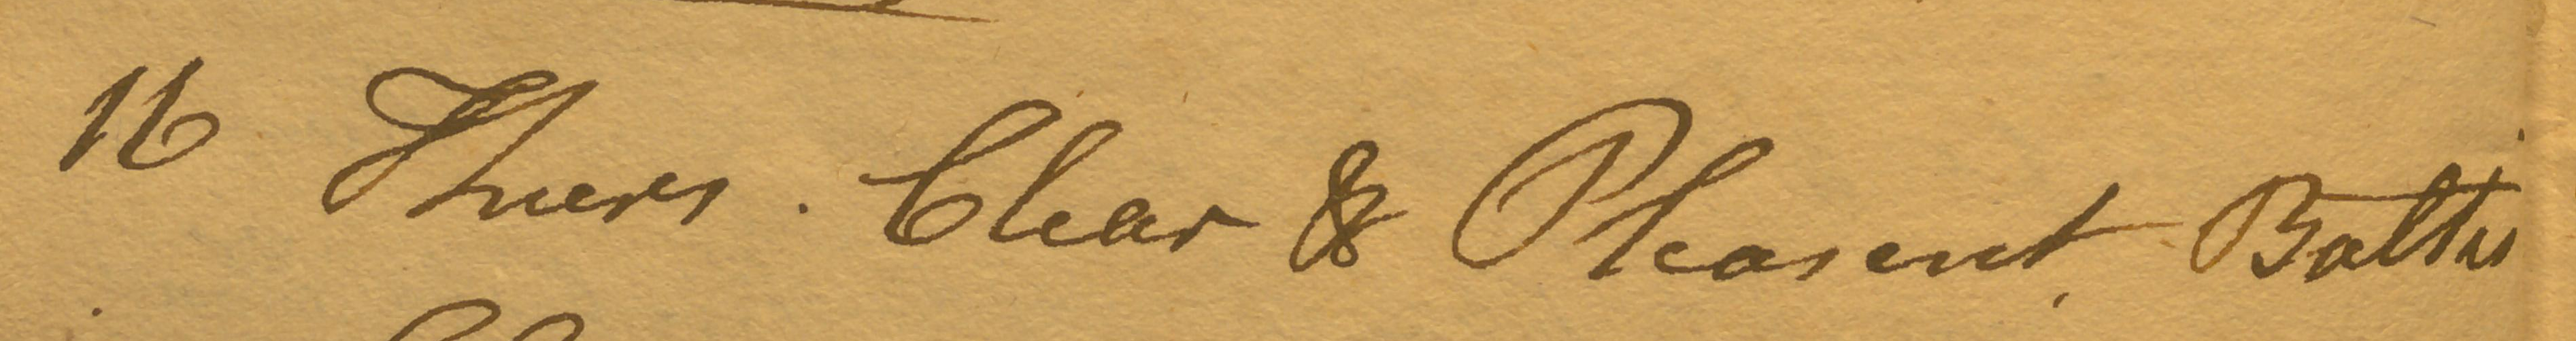16 Thurs^s. Clear & Pleasent Baltes
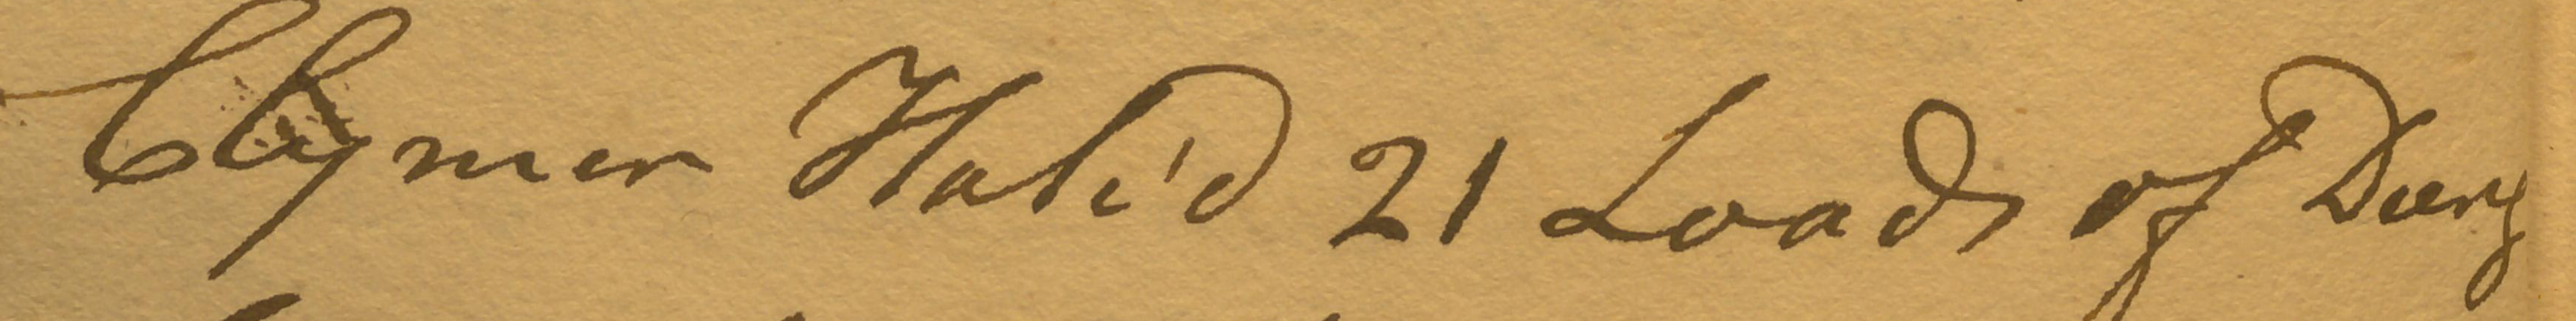Clymer Hale'd 21 Loads of Dung
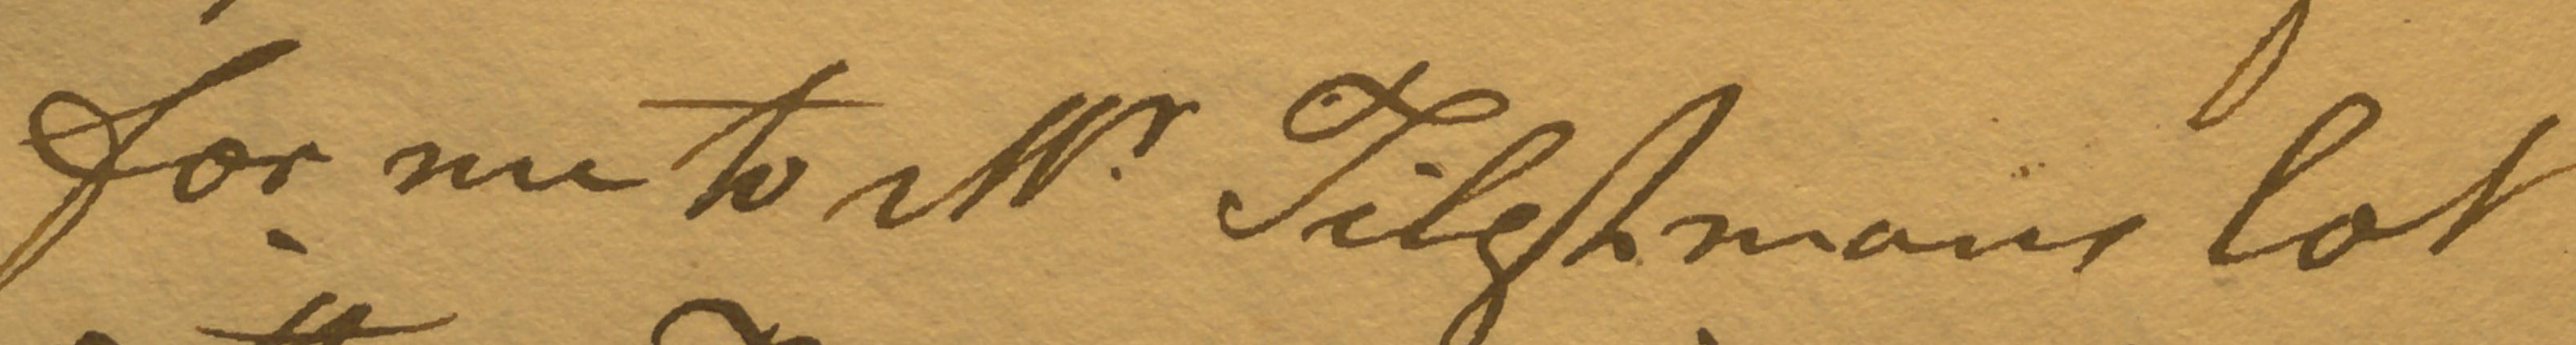for me to M^r. Tilghmans lot
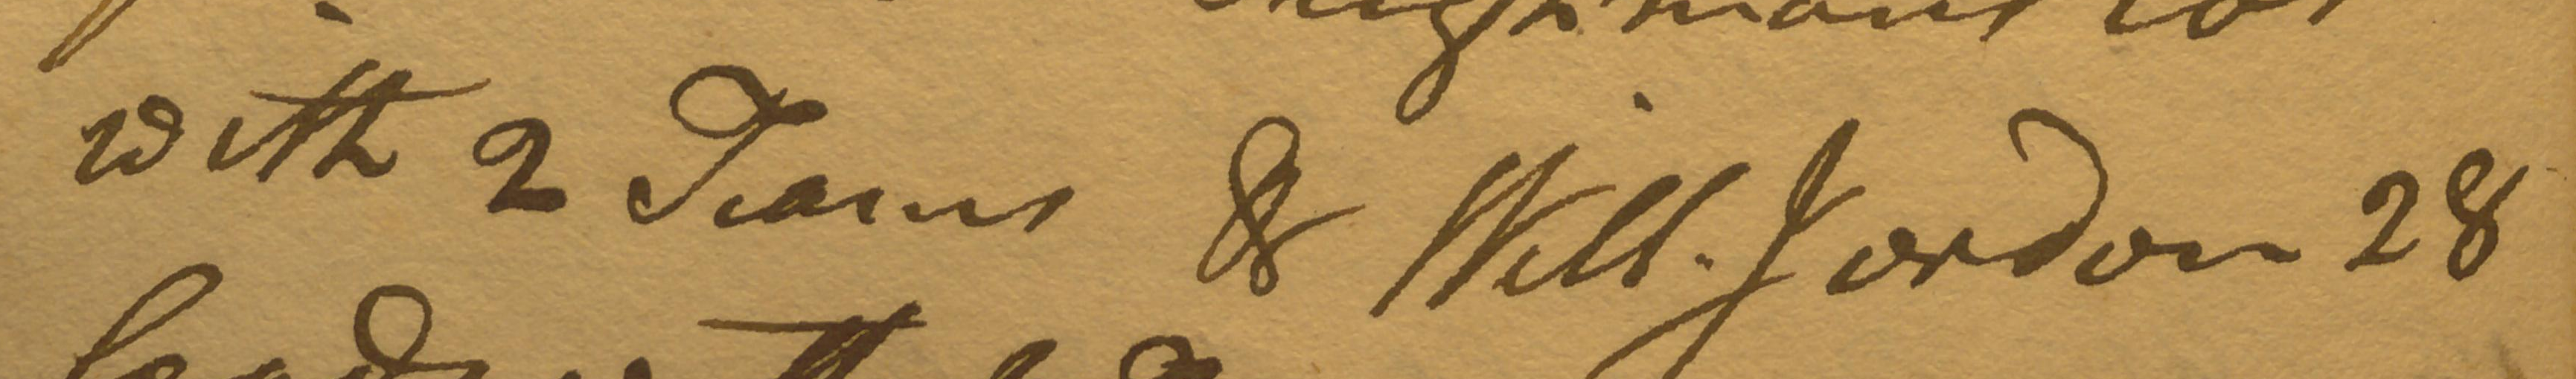with 2 Teams & Will Jordon 28
